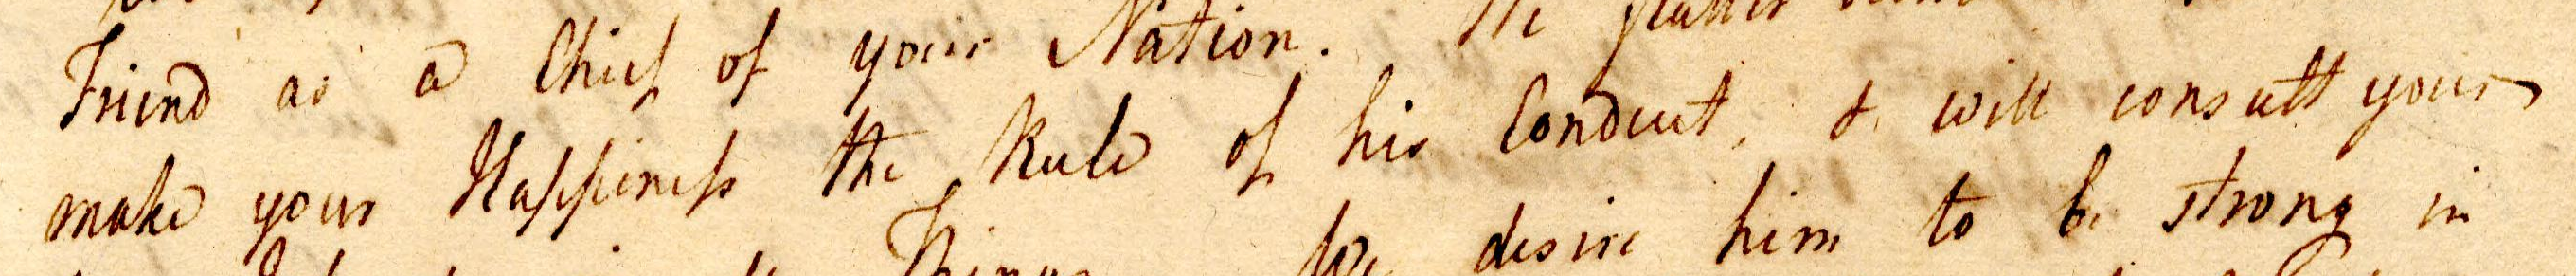make your Happiness the Rule of his Conduct, & will consult your
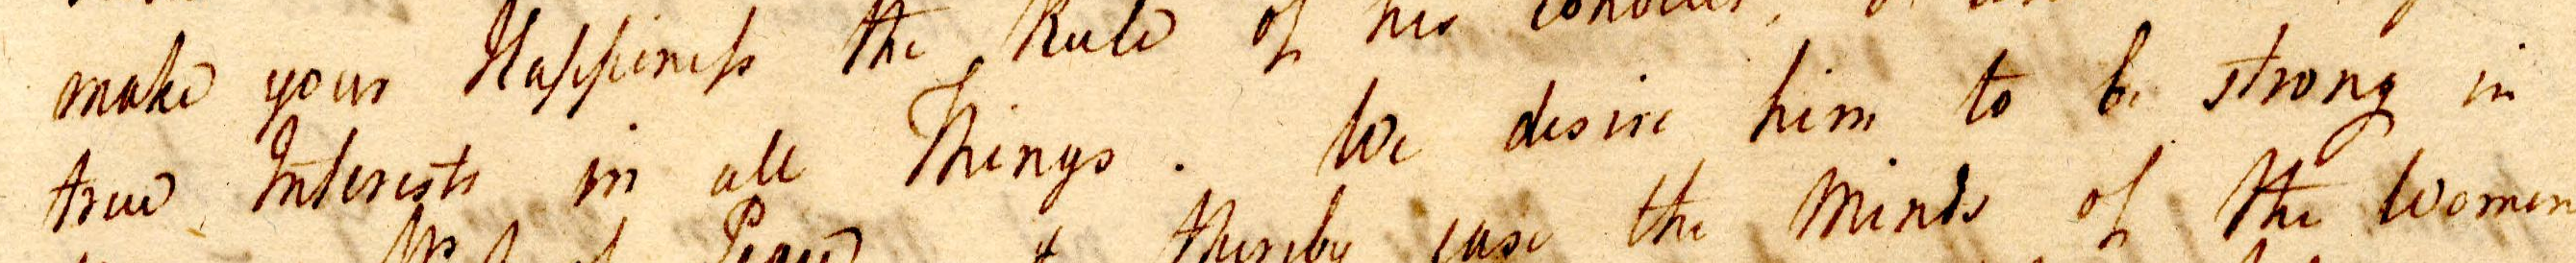true Interests in all Things. We desire him to be strong in
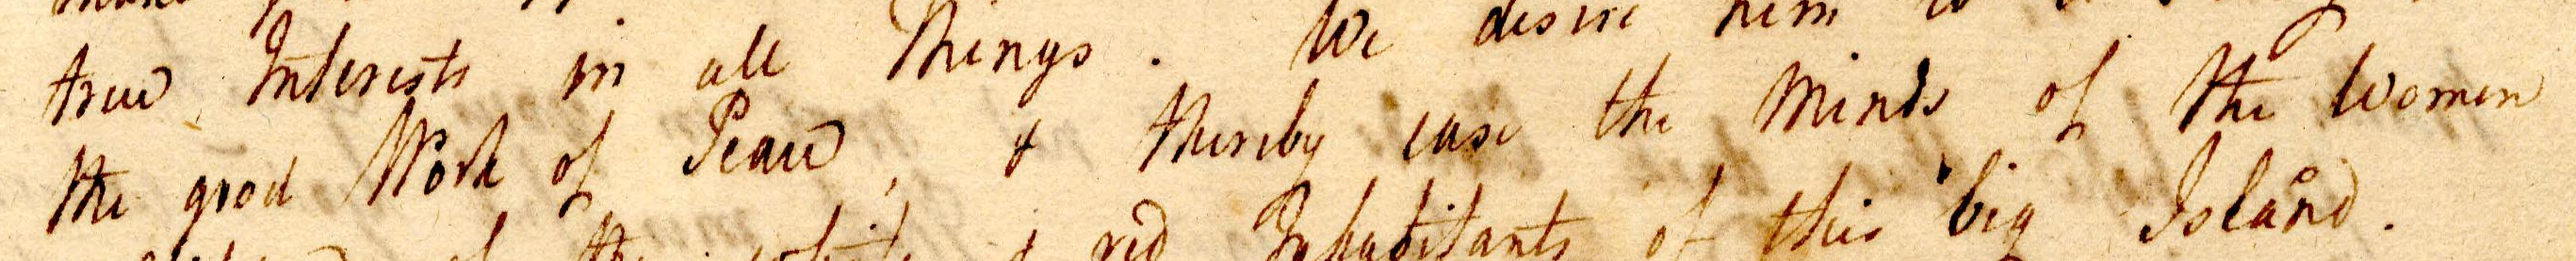the good Work of Peace & thereby ease the Minds of the Women
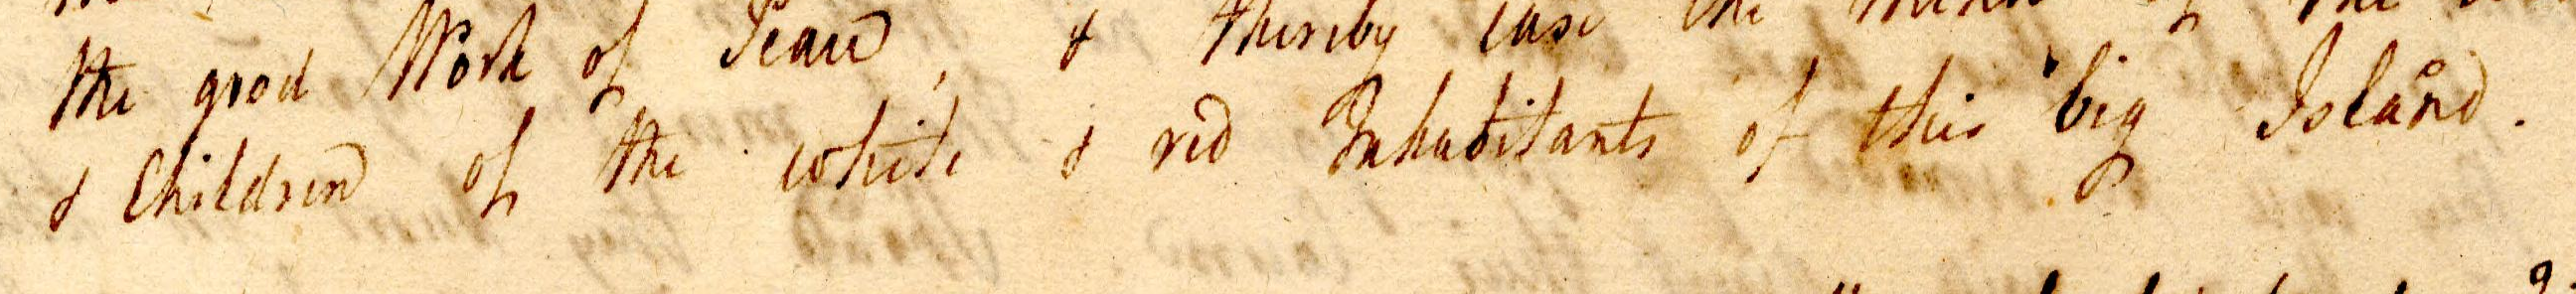& Children of the white & red Inhabitants of this big Island.
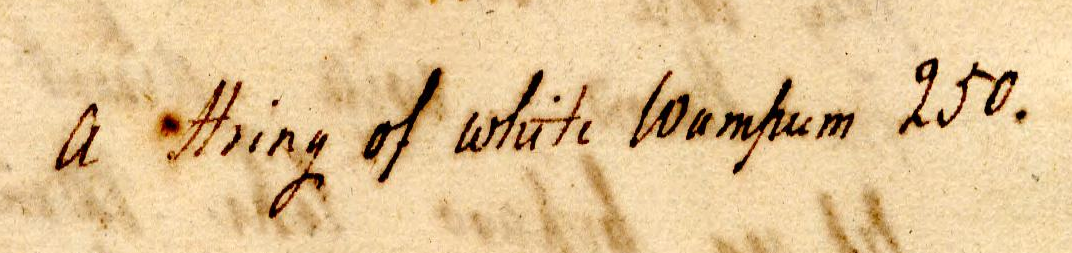A String of white Wampum 250.
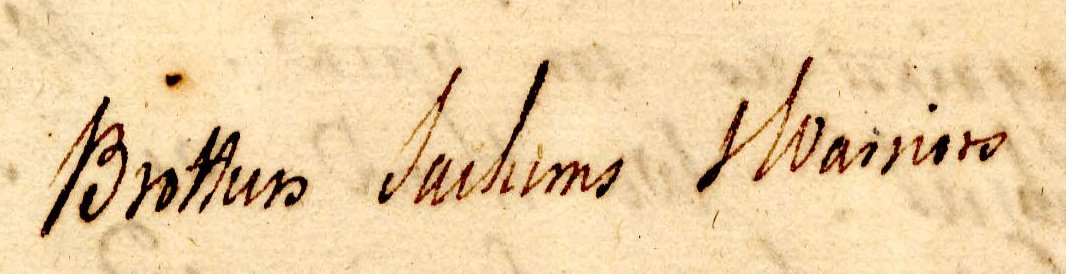Brothers Sachims & Warriors
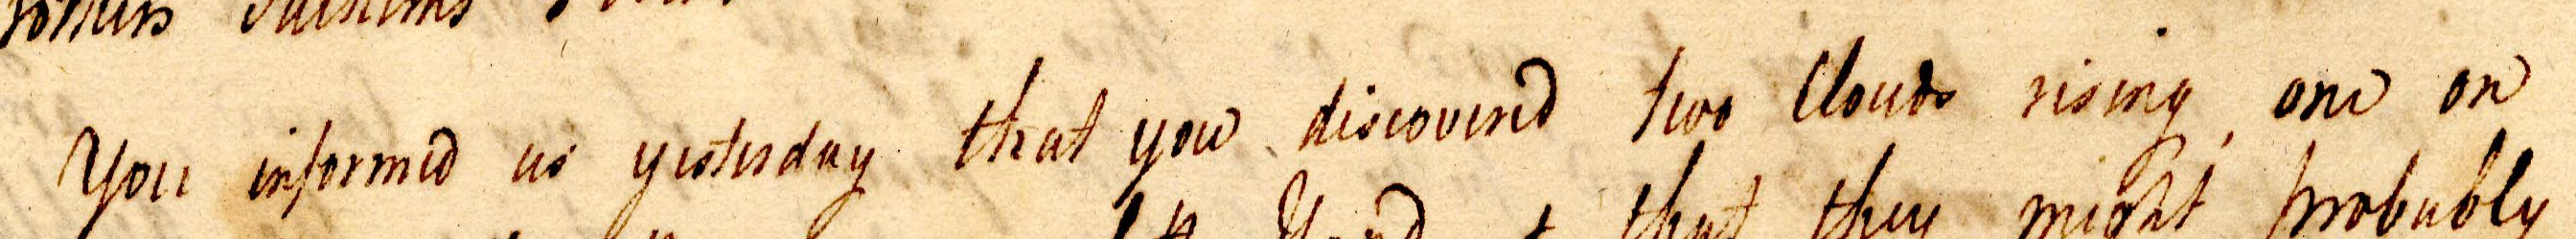You informed us yesterday that you discovered two Clouds rising one on
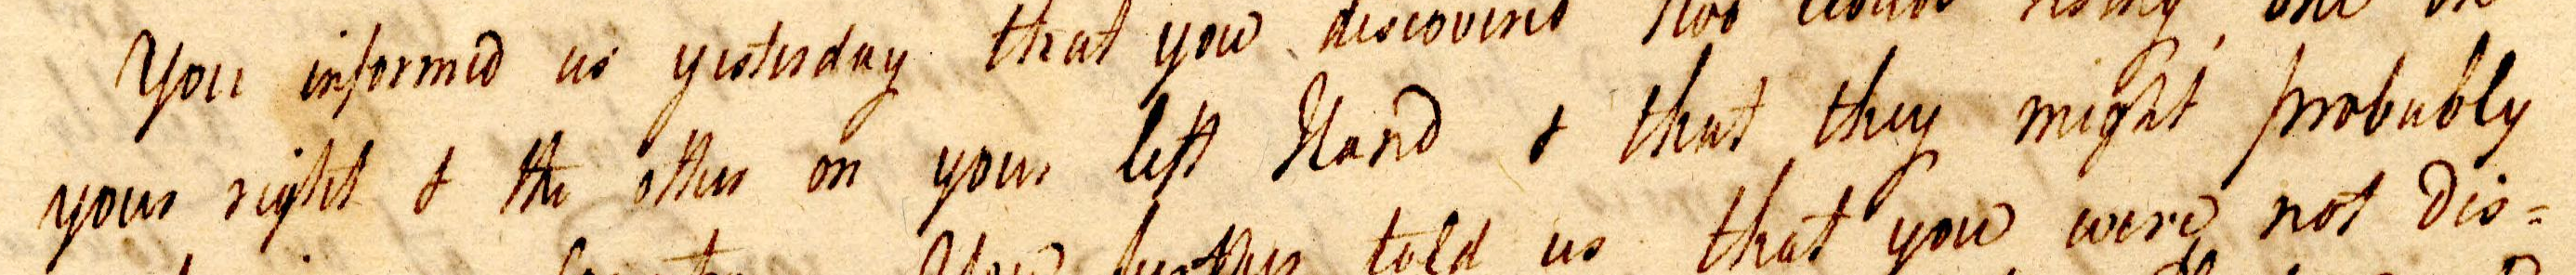your right & the other on your left Hand & that they might probably
